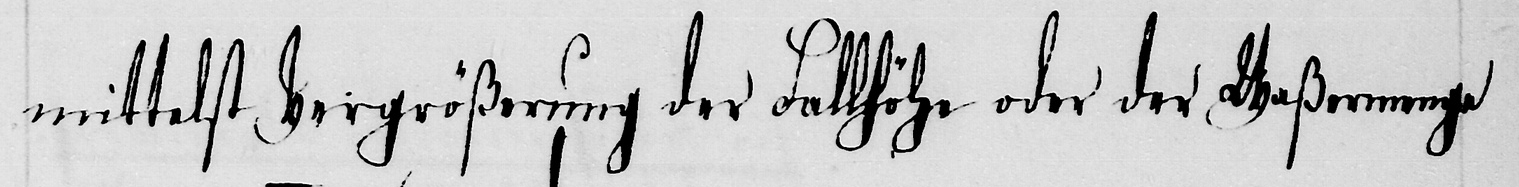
mittelst Vergrößerung der Fallhöhe oder der Waßermenge
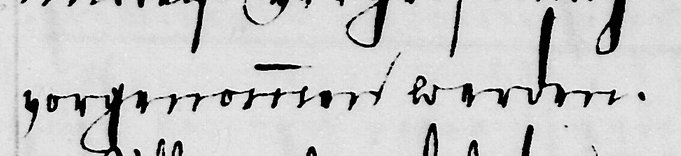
vorgenommen werden.
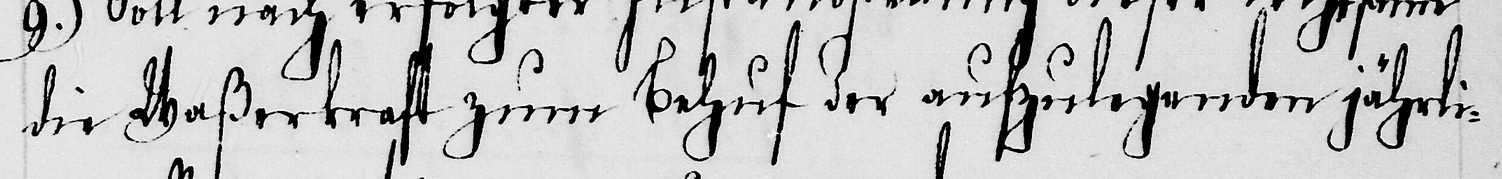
die Waßerkraft zum Behuf der aufzulegenden jährli¬
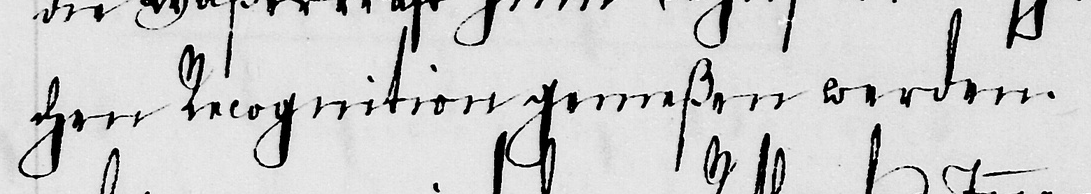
chen Recognition gemeßen werden.
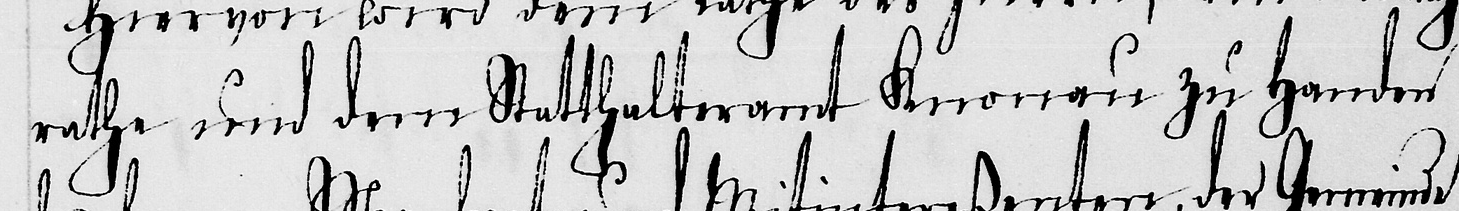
rathe und dem Statthalteramt Knonau zu Handen
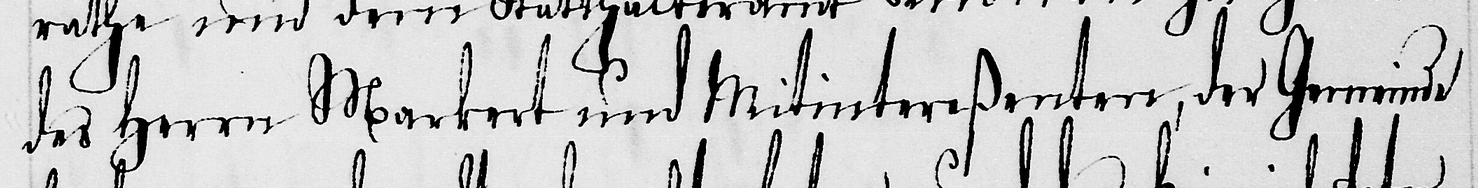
des Herrn Markert und Mitintereßenten, der Gemeinde
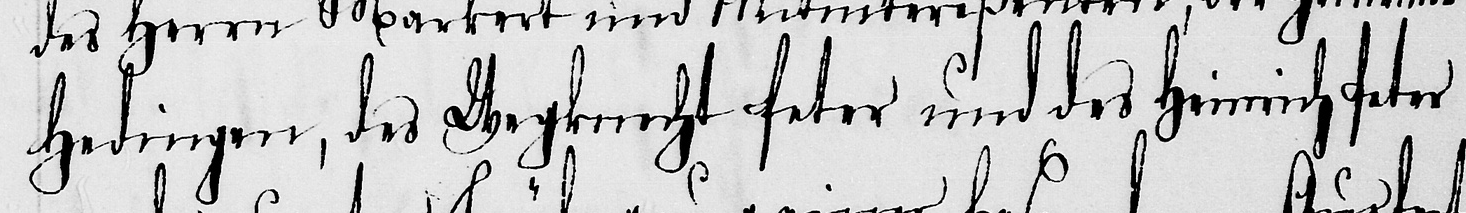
Hedingen, des Wegknecht Peter und des Heinrich Pe¬
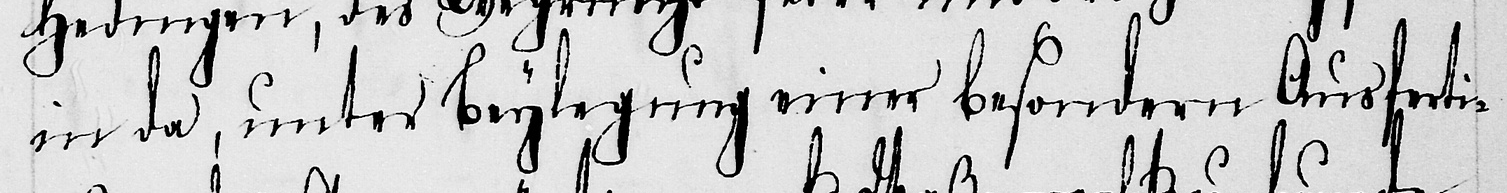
in da, unter Beylegung ener besondern Ausferti¬
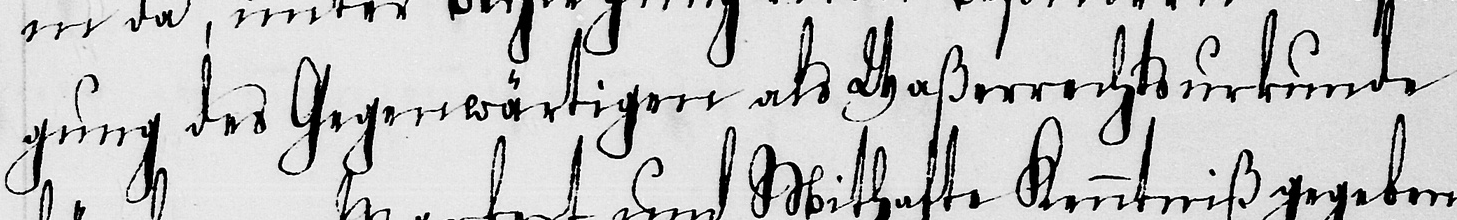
gung des Gegenwärtigen als Waßerrechtsurkunde
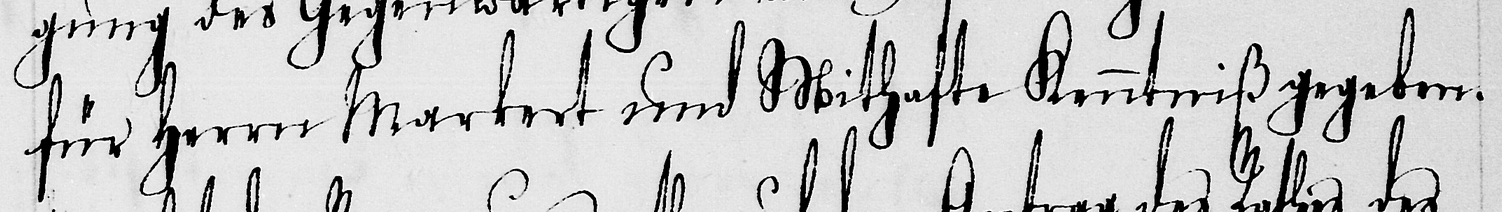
für Herrn Markert und Mithafte Kenntniß gegeben.
